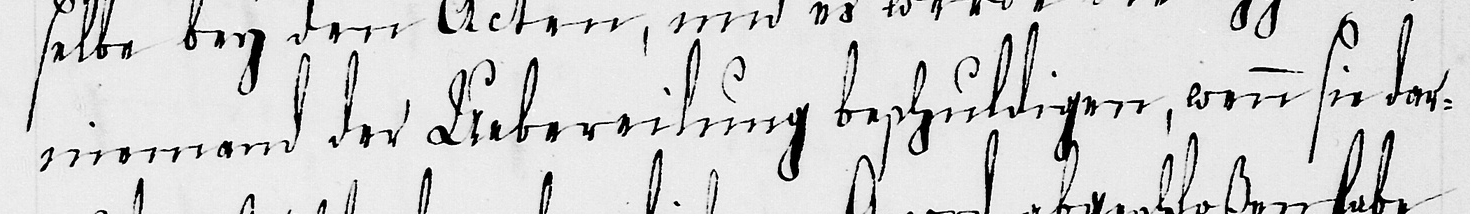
niemand der Uebereilung beschuldigen, wenn sie
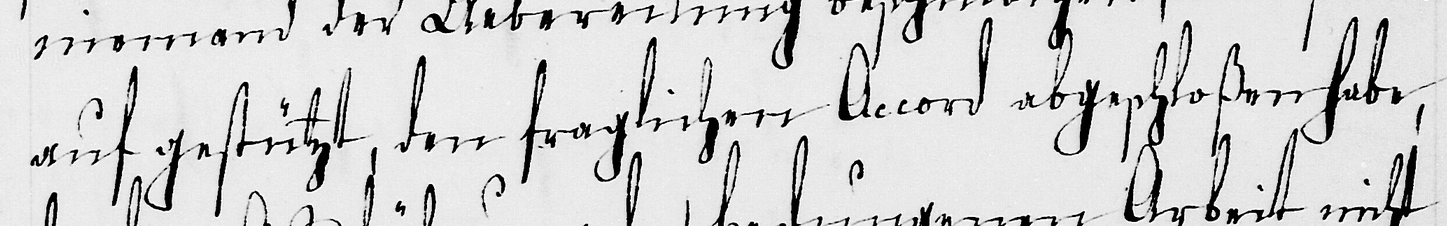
auf gestützt, den fraglichen Accord abgeschloßen habe,
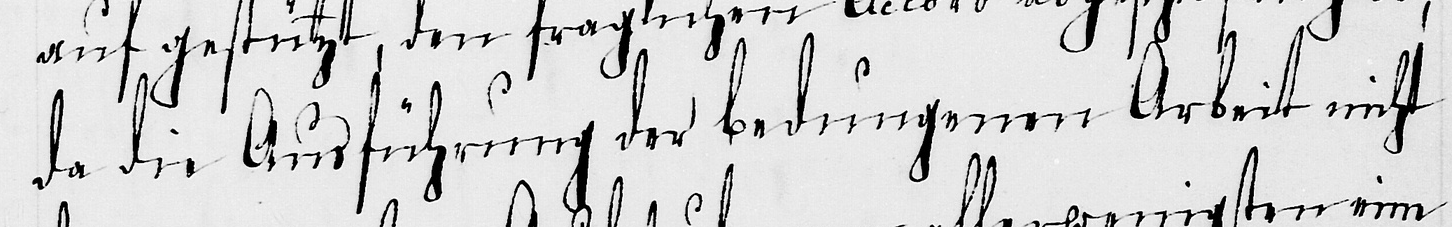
da die Ausführung der bedungenen Arbeit nicht
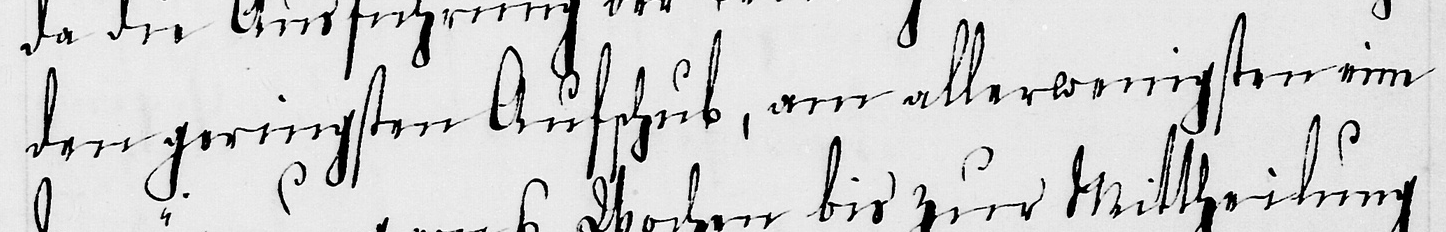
den geringsten Aufschub, am allerwenigsten eine
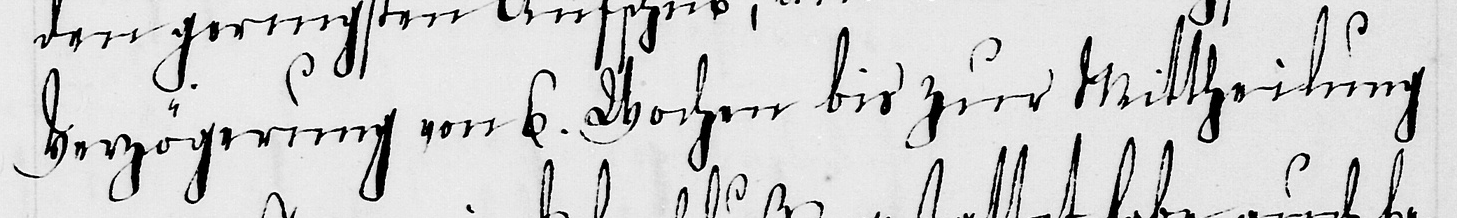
Verzögerung von 6. Wochen bis zur Mittheilung
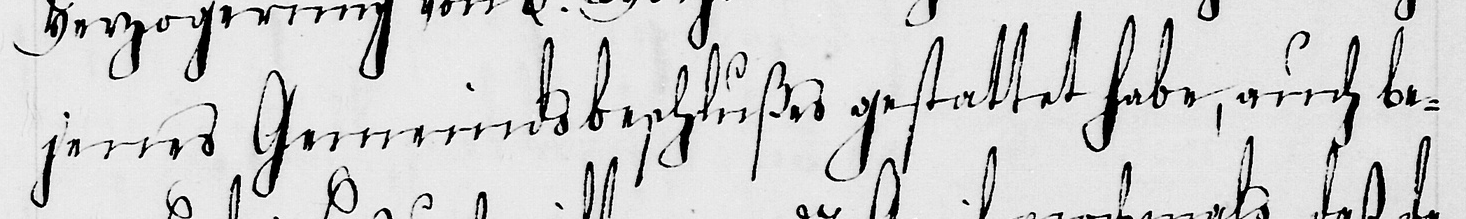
jenes Gemeindsbeschlußes gestattet habe, auch be¬
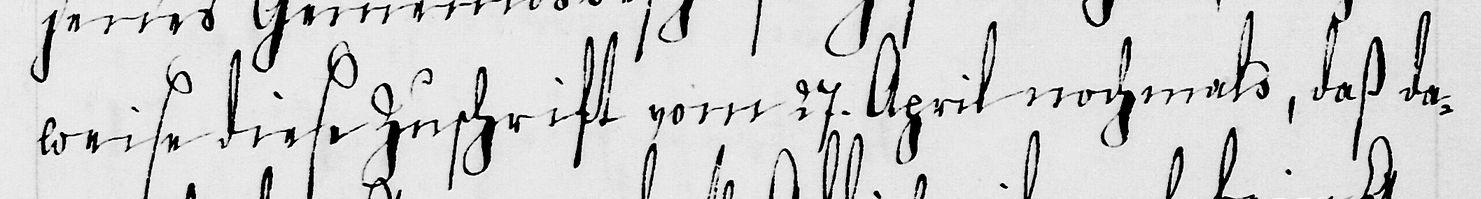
weise diese Zuschrift vom 27. April nochmals, daß da¬
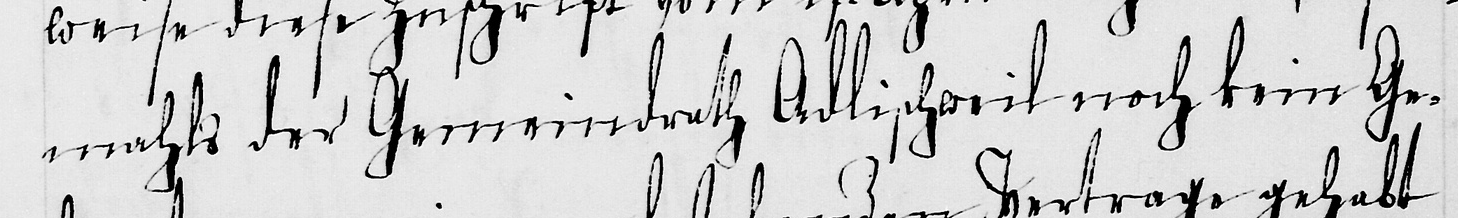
mahls der Gemeindrath Adlischweil noch kein Ge¬
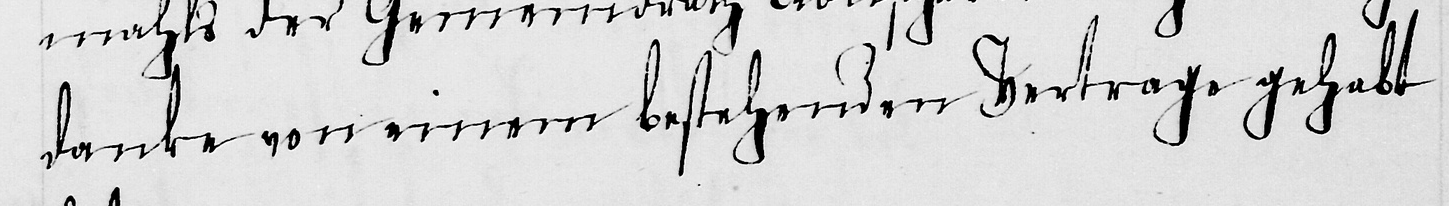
danke von einem bestehenden Vertrage gehabt
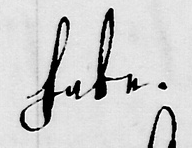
habe.
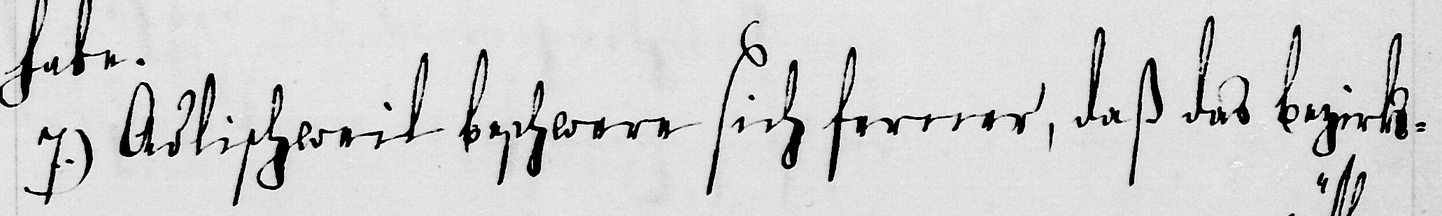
7.) Adlischweil beschwere sich ferner, daß das bezirks-
